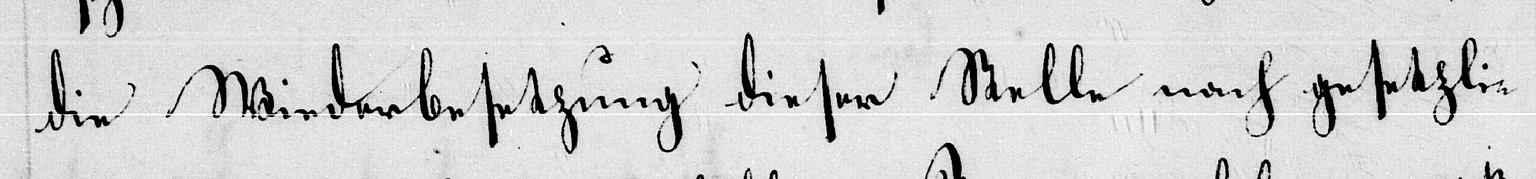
die Wiederbesetzung dieser Stelle nach gesetzli¬
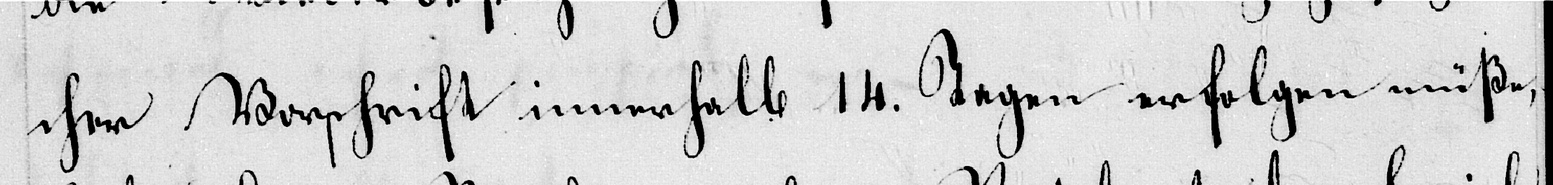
cher Vorschrift innerhalb 14. Tagen erfolgen müße,
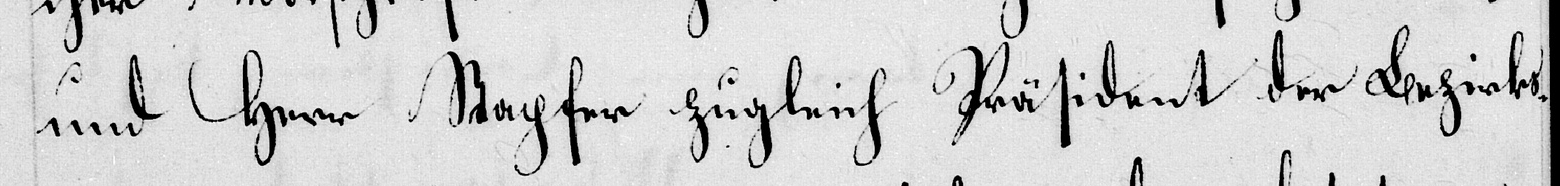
und Herr Stapfer zugleich Präsident der Bezirks¬
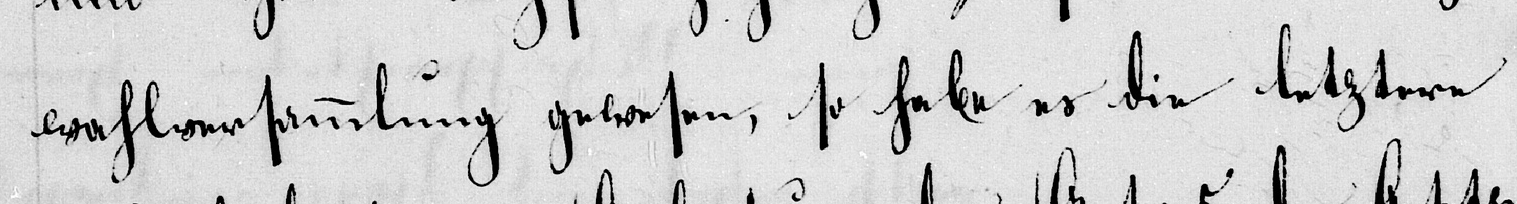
wahlversammlung gewesen, so habe es die letztere
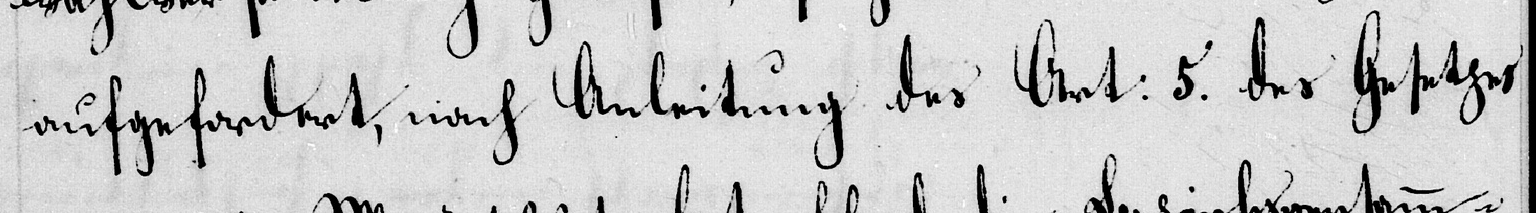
aufgefordert, nach Anleitung des Art: 5. des Gesetzes
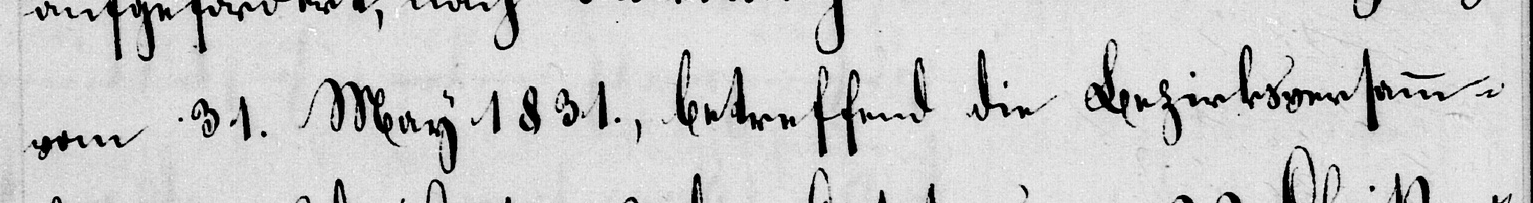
vom 31. März 1831., betreffend die Bezirksversamm¬
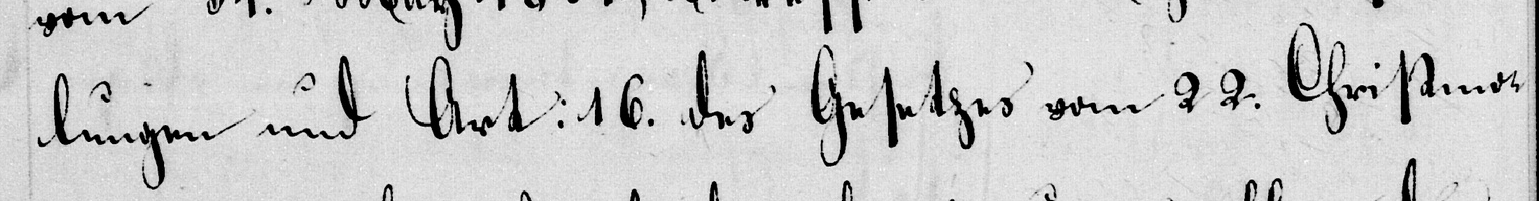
lungen und Art: 16. des Gesetzes vom 22. Christmo¬
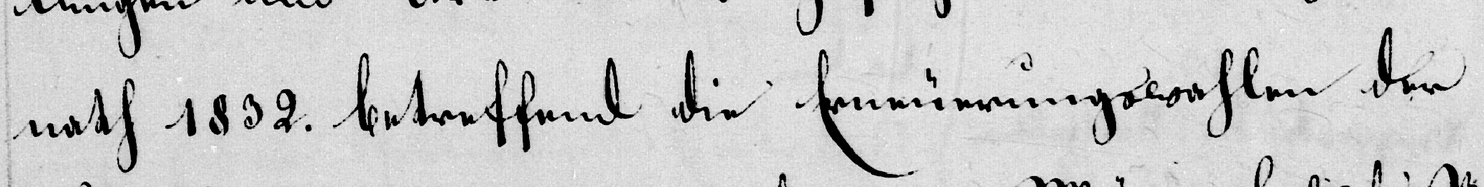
nath 1832. betreffend die Erneuerungswahlen der
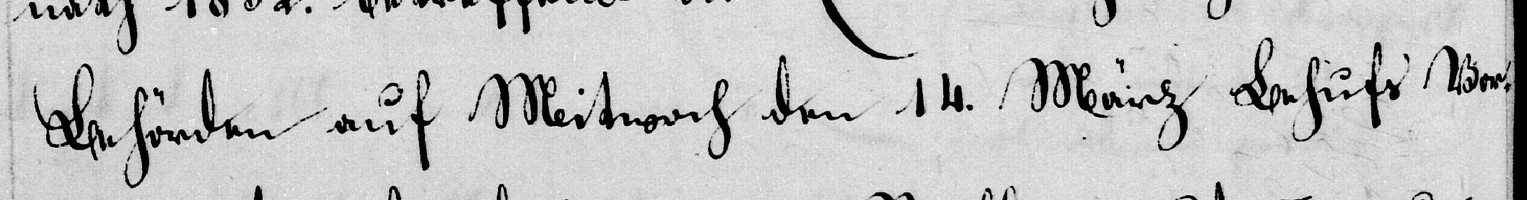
Behörden auf Mitwoch den 14. März Behufs Vor¬
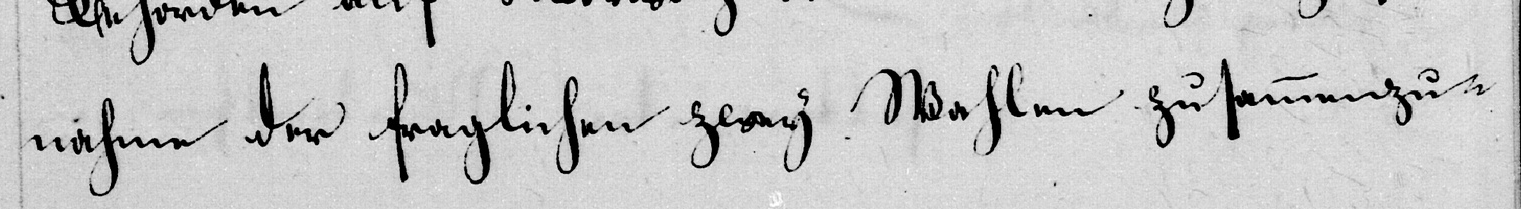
nahme der fraglichen zwey Wahlen zusammenzu-
